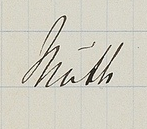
Muth
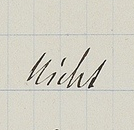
nicht
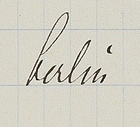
sinken
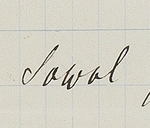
ich nicht
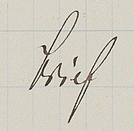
sich
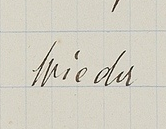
Berlin das
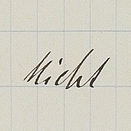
wesent-
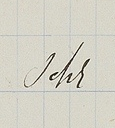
lich
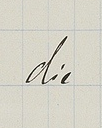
die
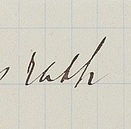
Personen
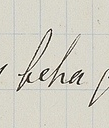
die
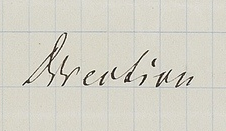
Direction
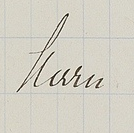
gegen
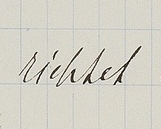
spector.
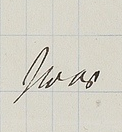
Fierz lege
